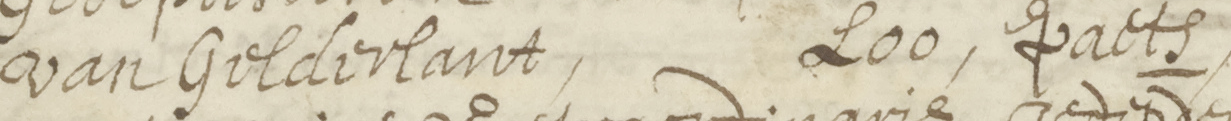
van Gelderlant, Loo, paets,
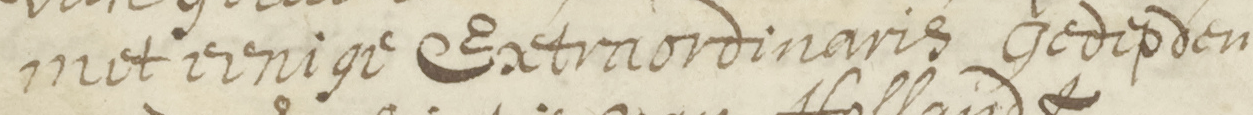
met eenige Extraordinaris Gedepden
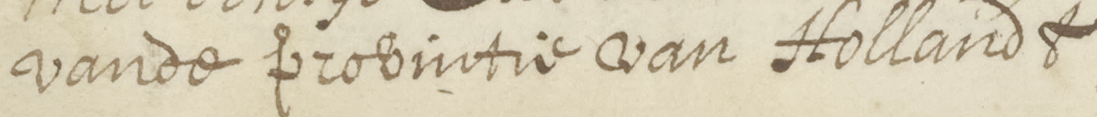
vande provintie van Hollandt,
